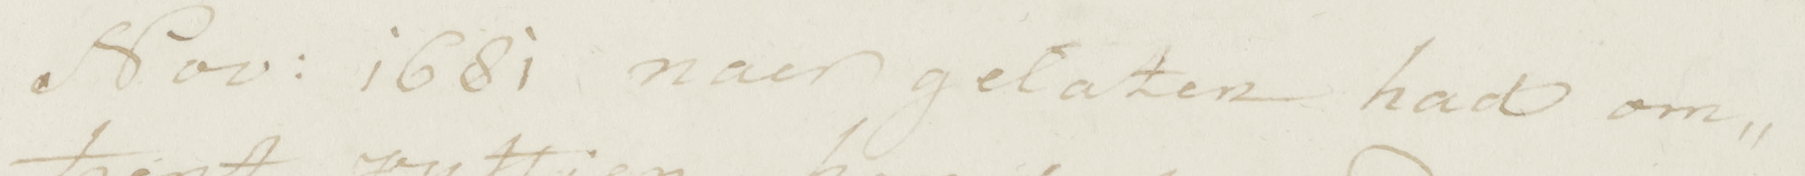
Nov: 1681 naer gelaten had om„
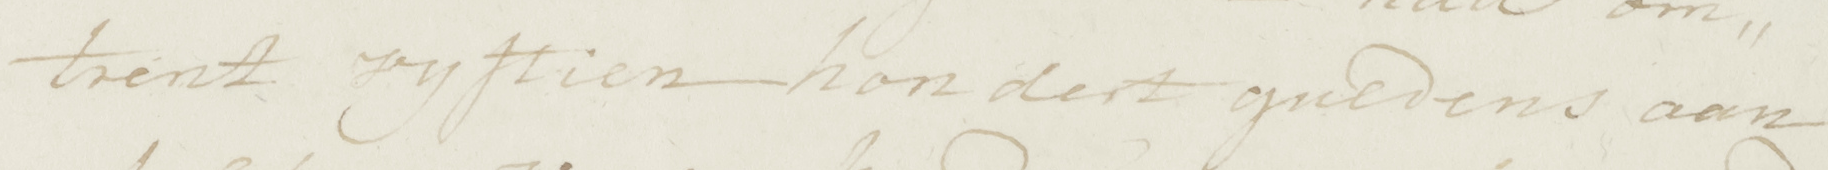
trent vijftien hondert guldens aan
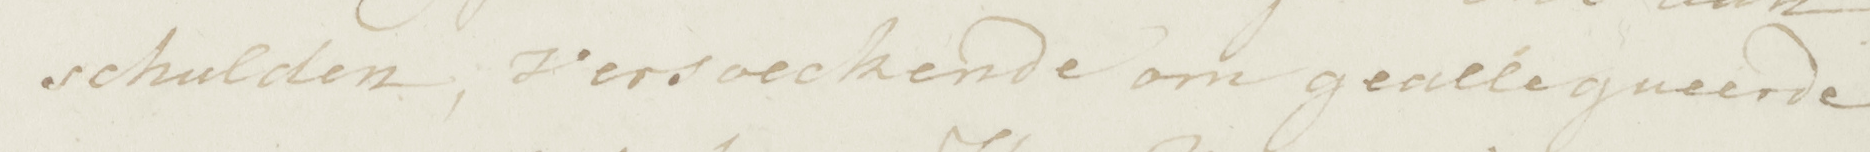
schulden, versoeckende om geallegueerde
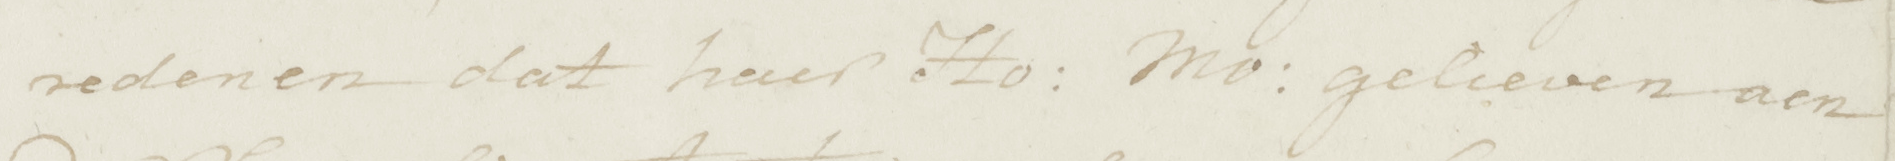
redenen dat haer Ho: Mo: gelieven aen
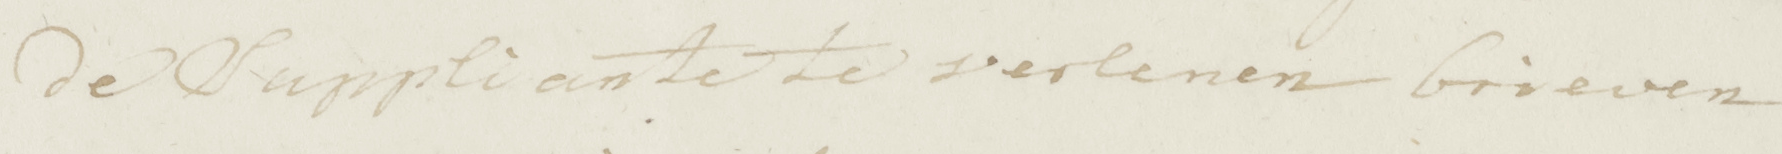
de Suppliante te verlenen brieven
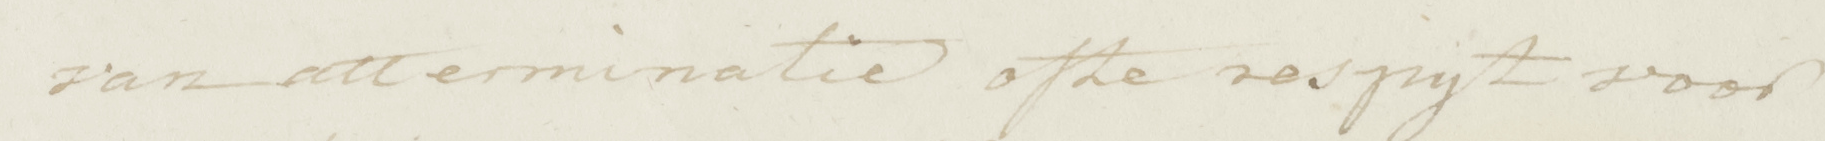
van atterminatie ofte respijt voor
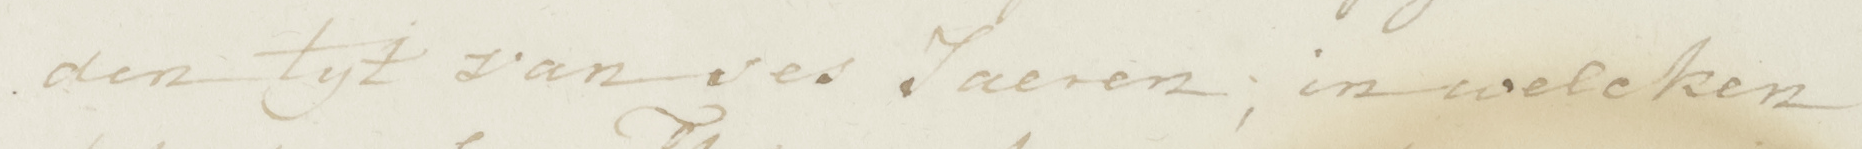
den tijt van ses Jaeren in welcken
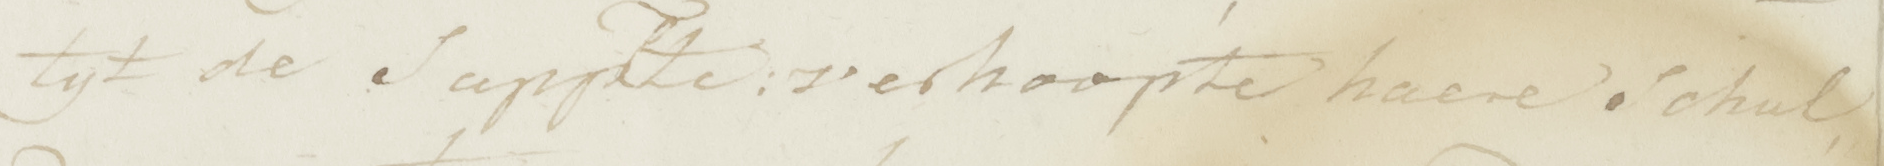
tijt de Supplte: verhoopte haere Schul„
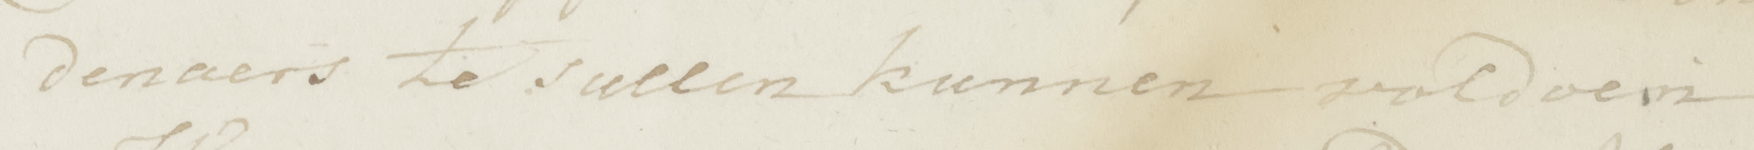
denaers ze sullen kunnen voldoen.
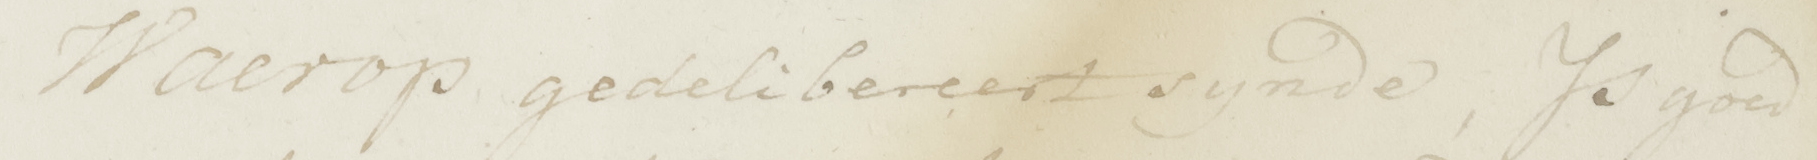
Waerop gedelibereert synde, Is goed
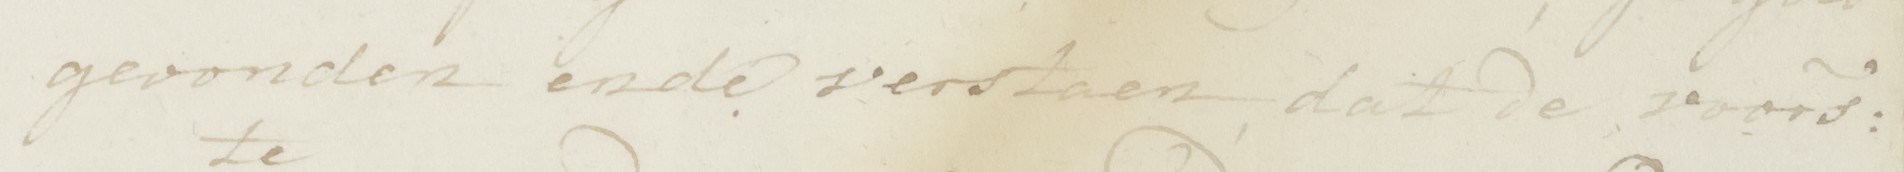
gevonden ende verstaen dat de voors:
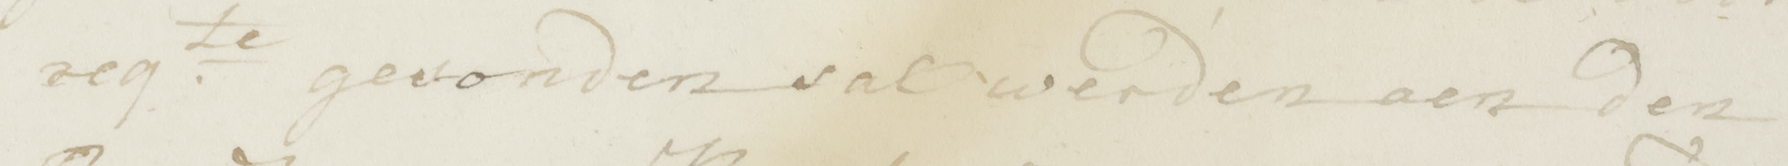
reqte gevonden sal werden aen den
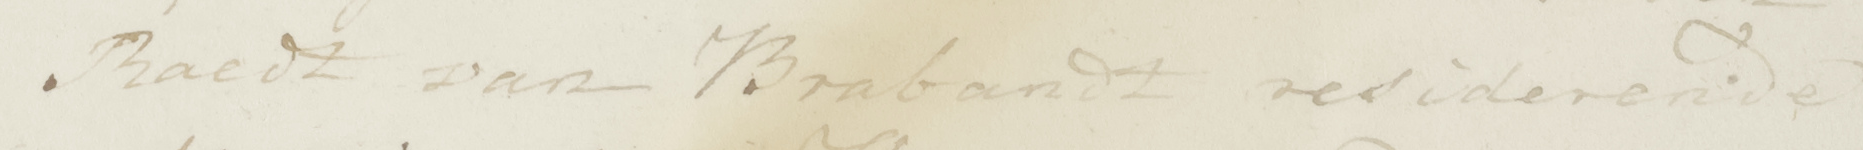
Raedt van Brabandt residerende
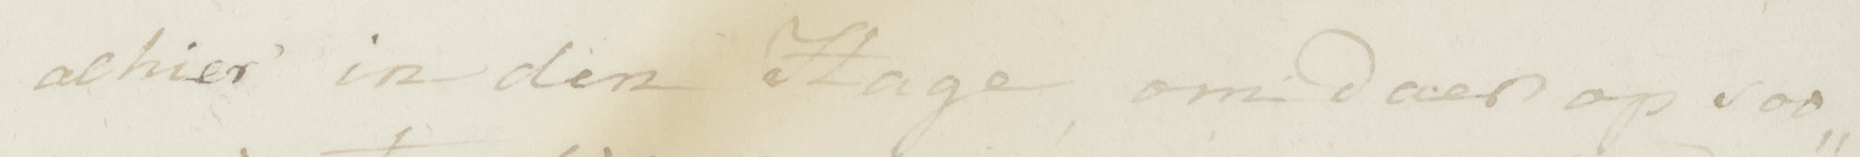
alhier in den Hage om daer op soo„
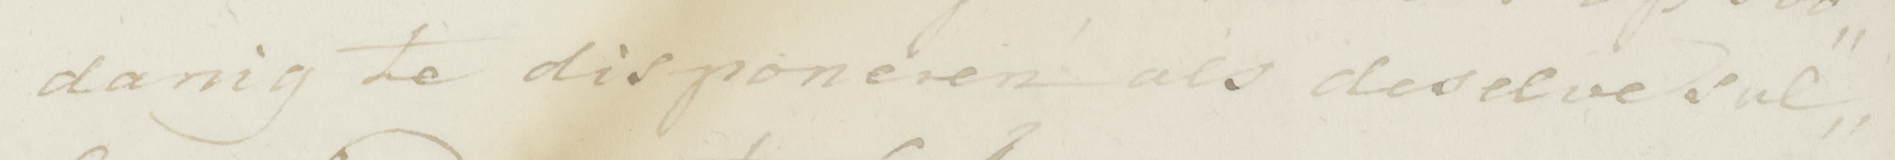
danig te disponeren als deselve sul„
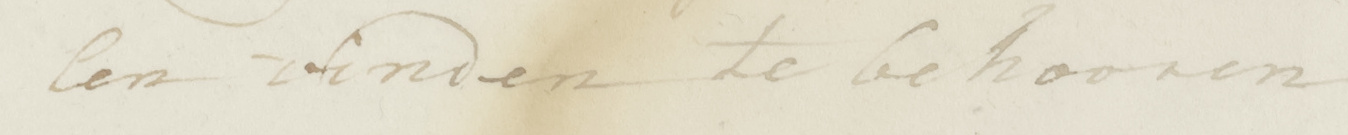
len vinden te behooren.
